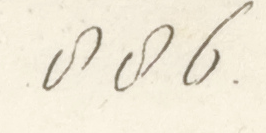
886.
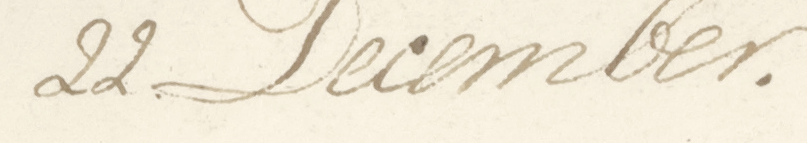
22. December.
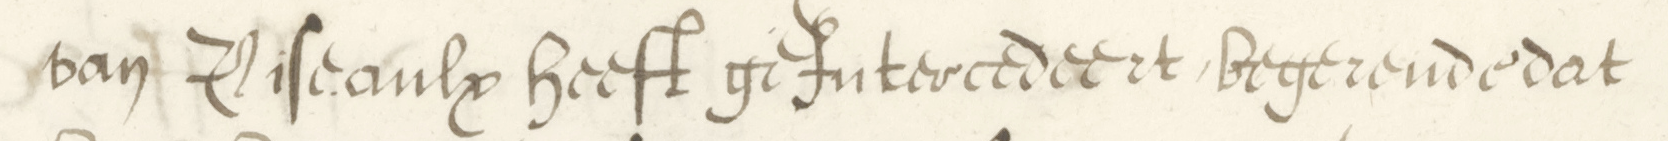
van Piseaulx heeft geIntercedeert, begerende dat
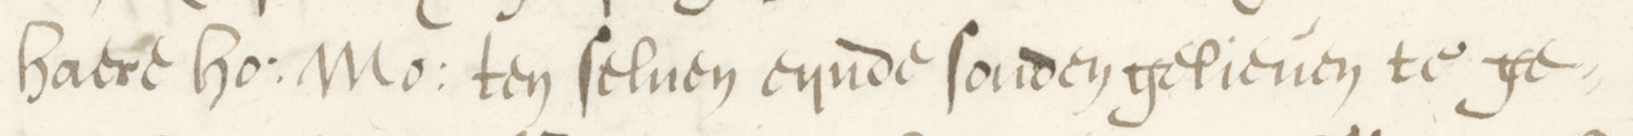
haere ho:Mo: ten seluen eynde souden gelieuen te ge„
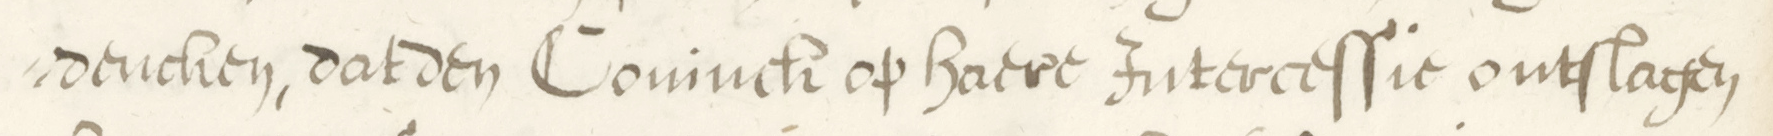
,,dencken, dat den Coninck op haere Intercessie ontslagen
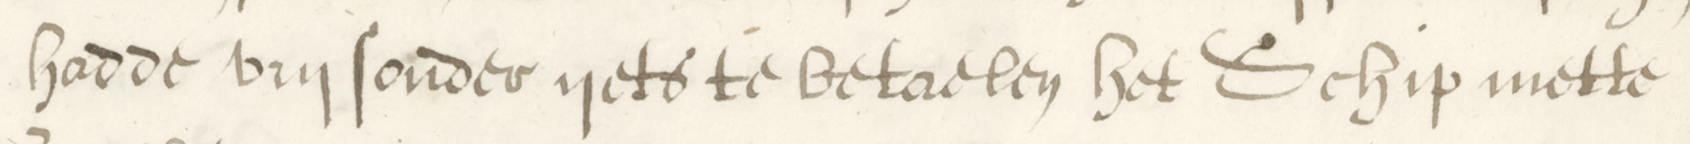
hadde vry sonder yets te betaelen het Schip mette
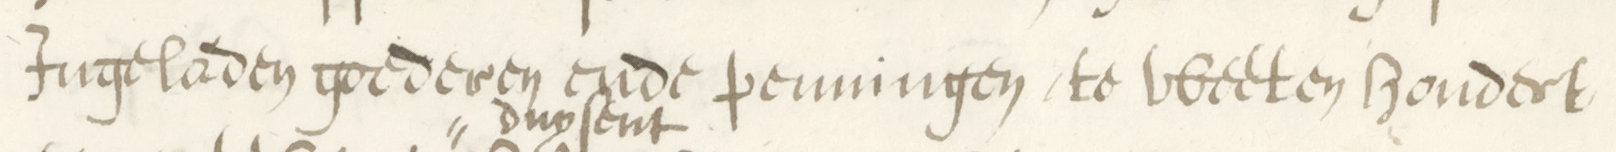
Ingeladen goederen ende penningen, te weeten hondert
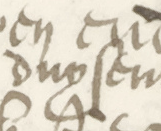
,,duysent
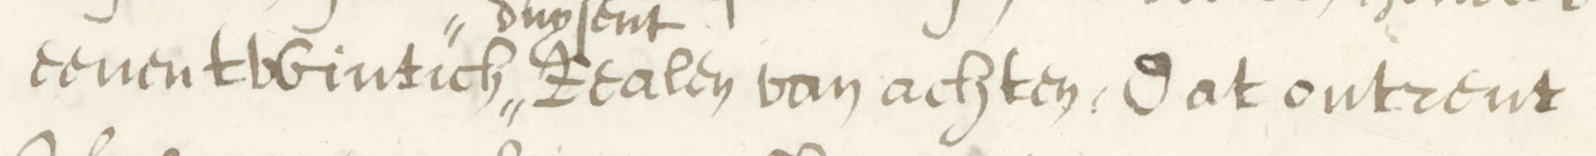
eenentwintich,, Realen van achten, Dat ontrent
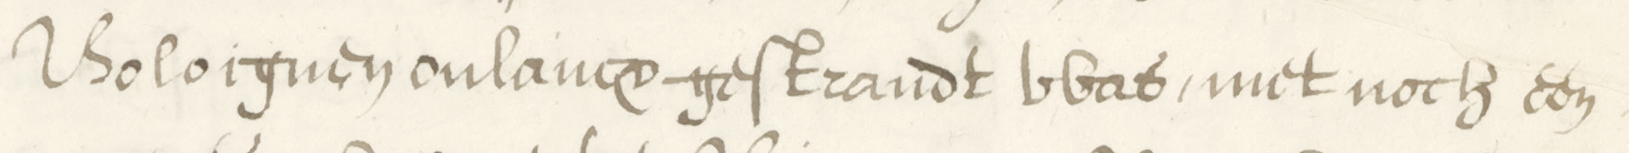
Boloignen onlancx gestrandt was, met noch een
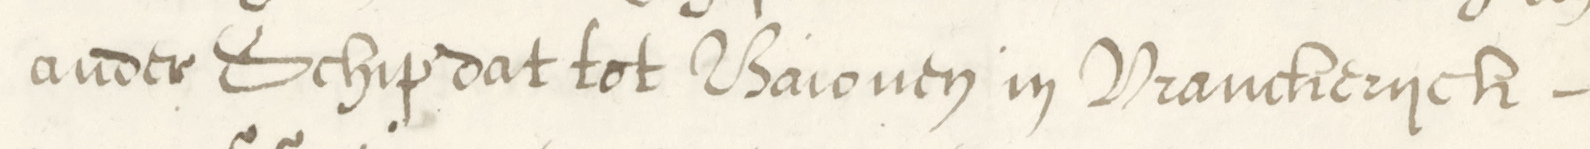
ander Schip dat tot Baionen in Vranckeryck
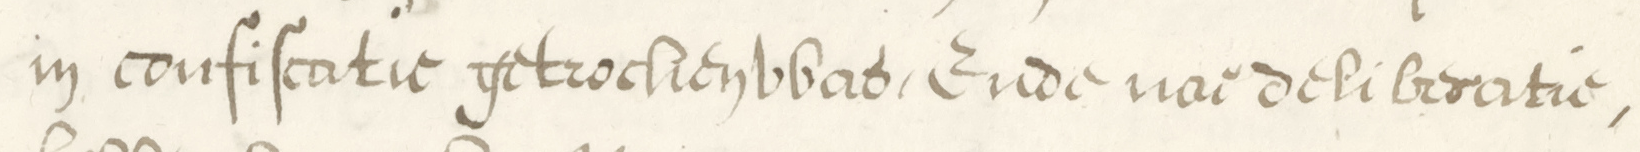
in confiscatie getrocken was. Ende nae deliberatie,
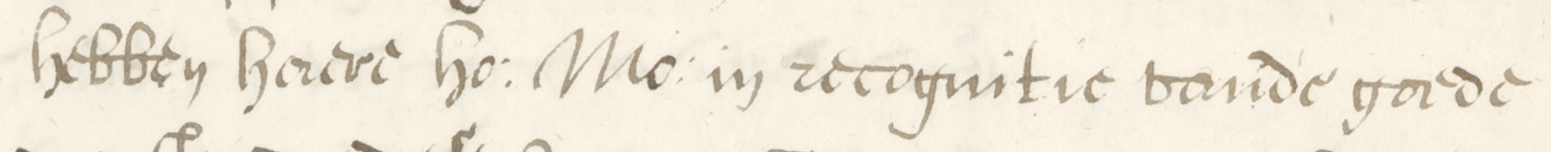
hebben haere Ho:Mo: in recognitie vande goede
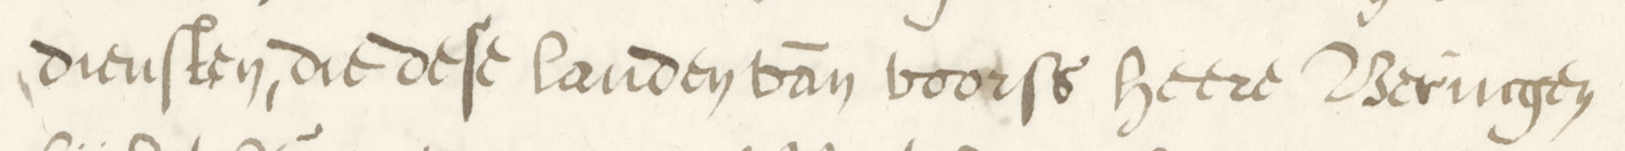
diensten, die dese landen van voors heere Beringen
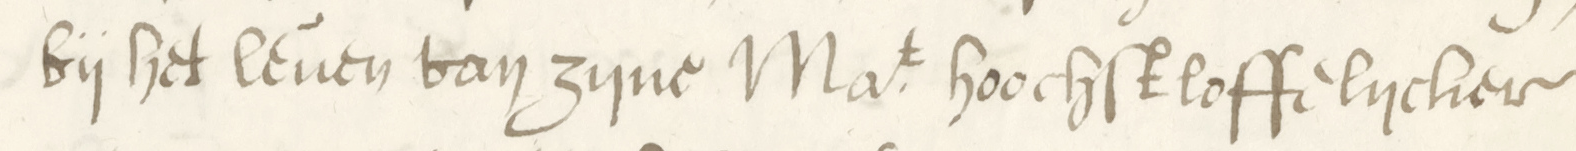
bij het leuen van zyne Mat. hoochstloffelycker
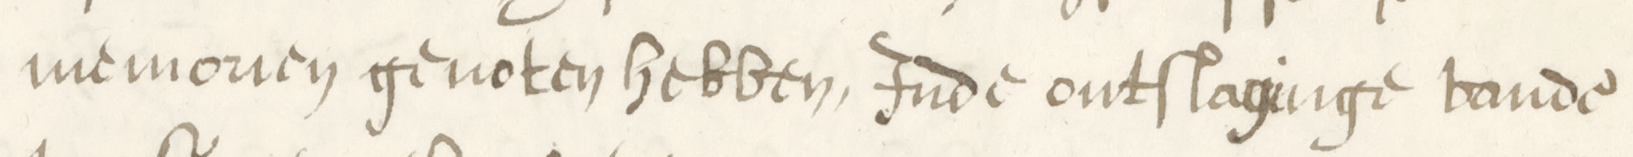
memorien genoten hebben, Inde ontslaginge vande
